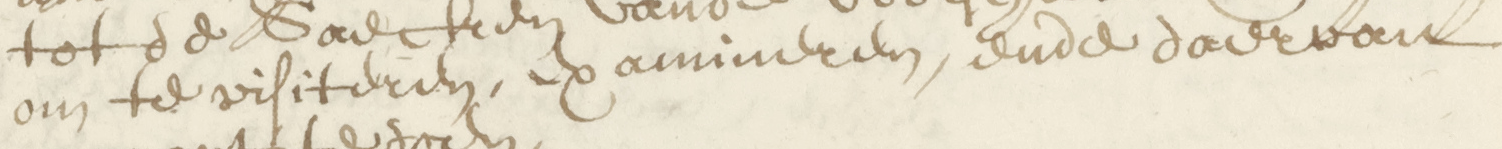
om te visiteren, Examineren, ende daervan
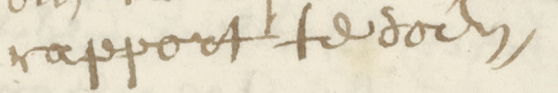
rapport te doen.
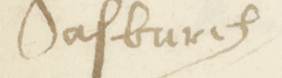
Sasburch
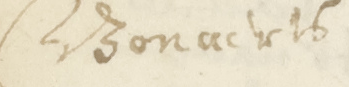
Bonaerts
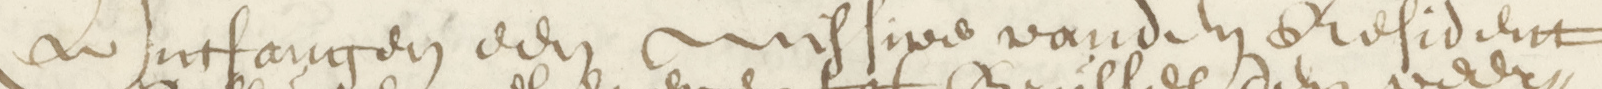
Ontfangen een Missive van den Resident
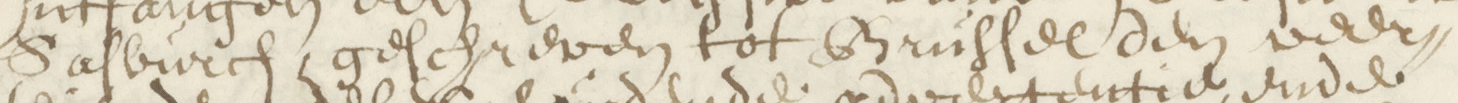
Sasburch, geschreven tot Brussel den veer„
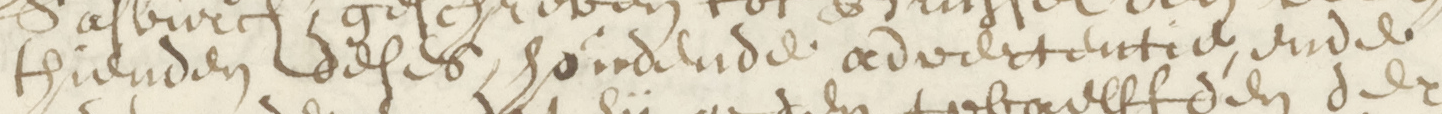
thienden deses, houdende advertentie, ende
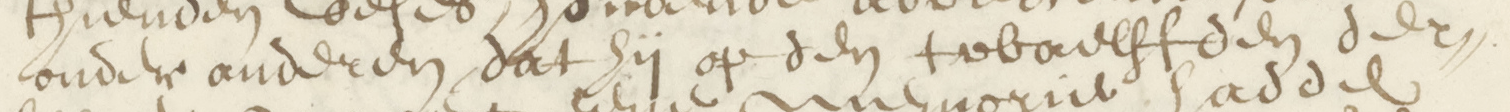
onder anderen dat hij op den twaelffden der„
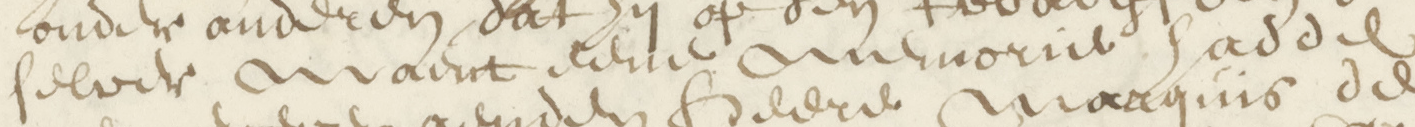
selver Maent eene Memorie hadde
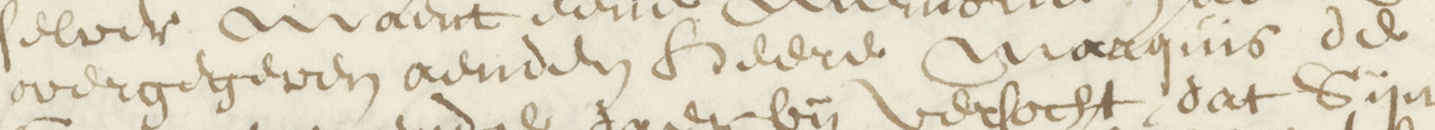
overgegeven aenden Heere Marquis de
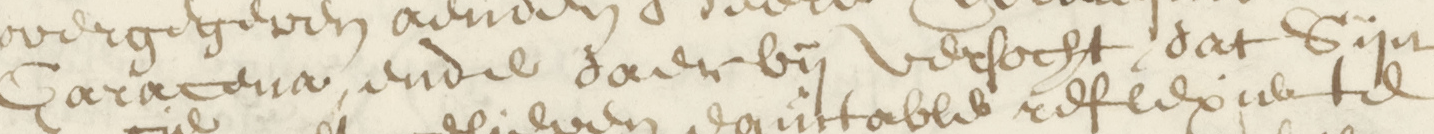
Caracena, ende daerbij versocht dat Sijn
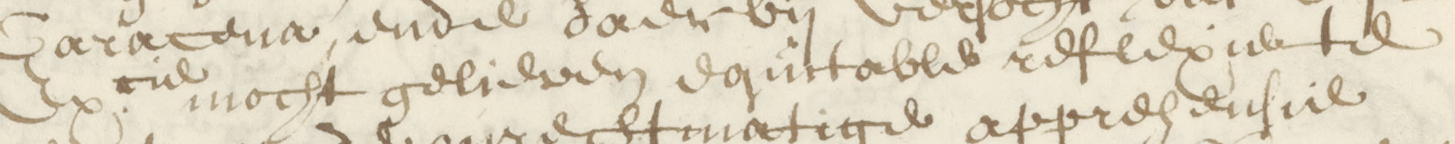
Excie mocht gelieven equitable reflexie te
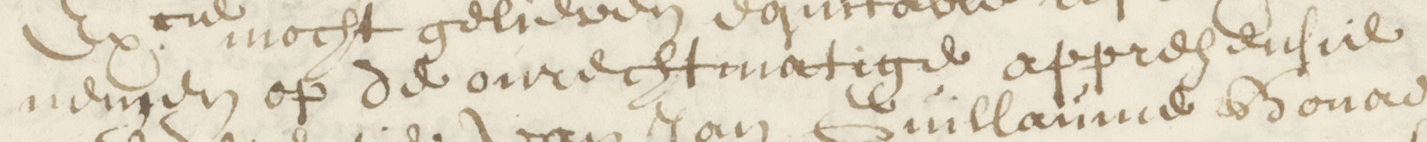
nemen op de onrechtmatige apprehensie
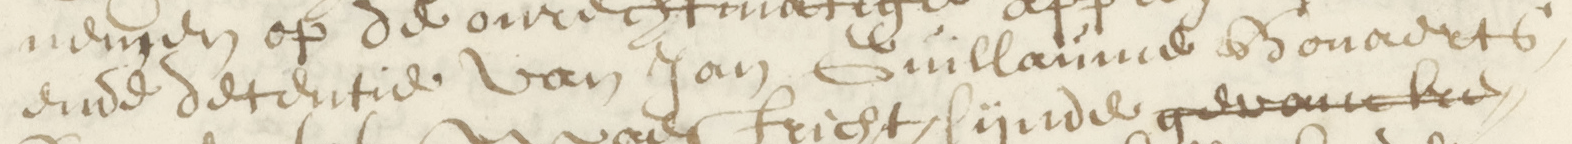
ende detentie van Jan Guillaume Bonaerts
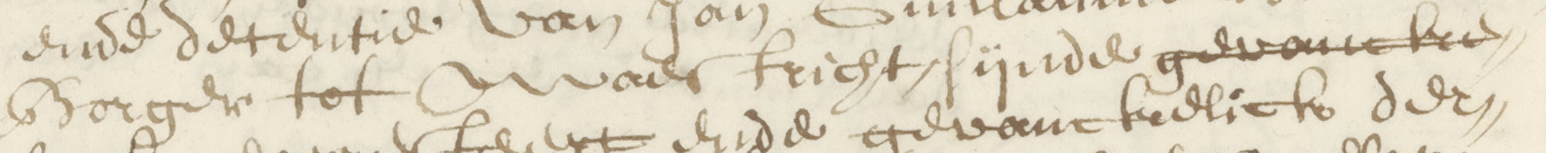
Borger tot Maestricht, sijnde gevancke„
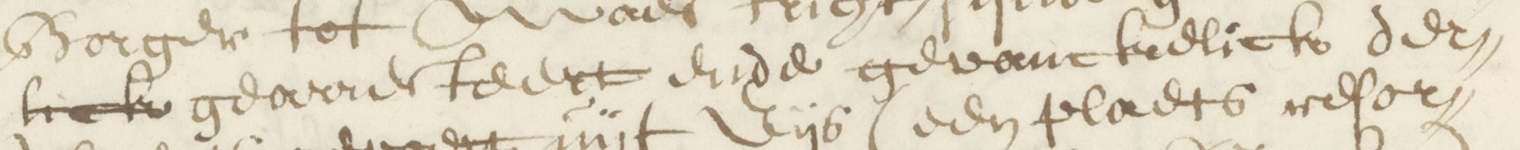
lick gearresteert ende gevanckelick der„
